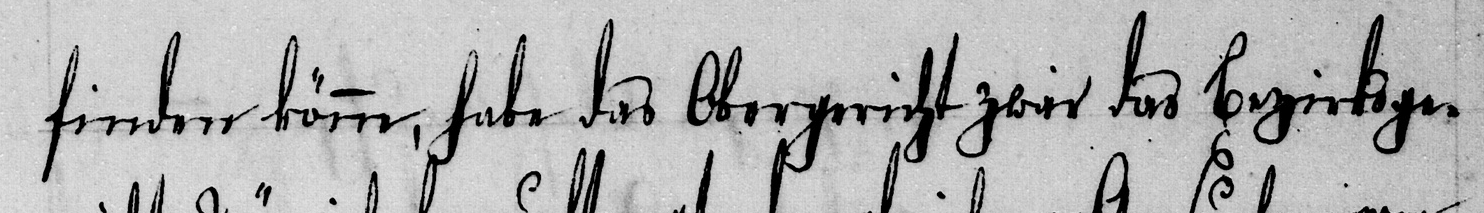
finden könne, habe das Obergericht zwar das Bezirksge¬
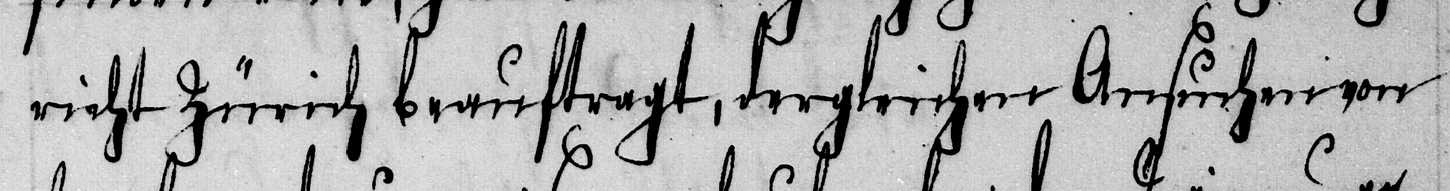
richt Zürich beauftragt, dergleichen Ansuchen von
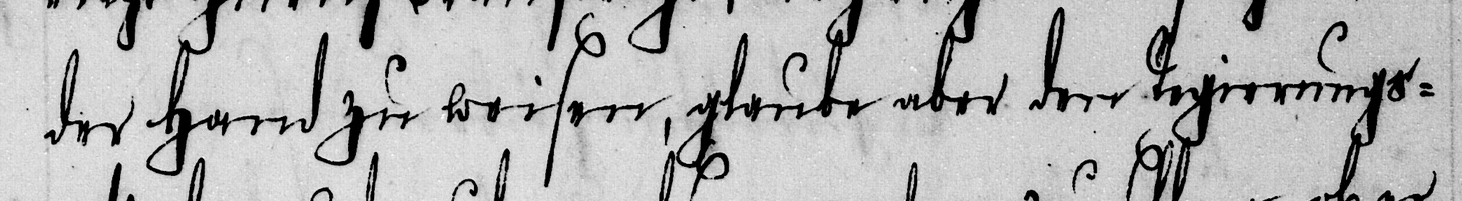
der Hand zu weisen, glaube aber den Regierungs¬
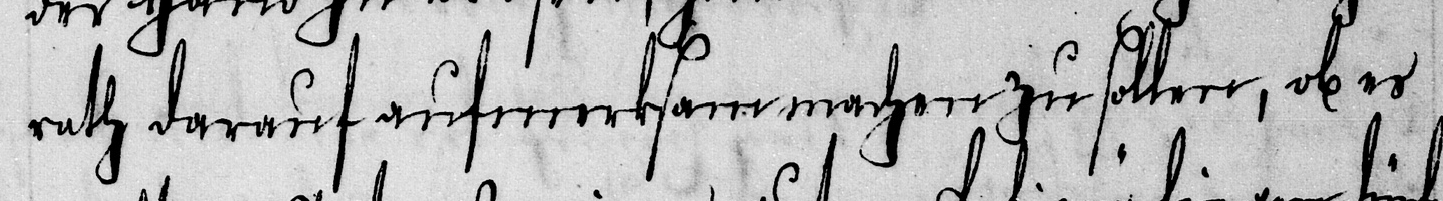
rath darauf aufmerksam machen zu sollen, ob es
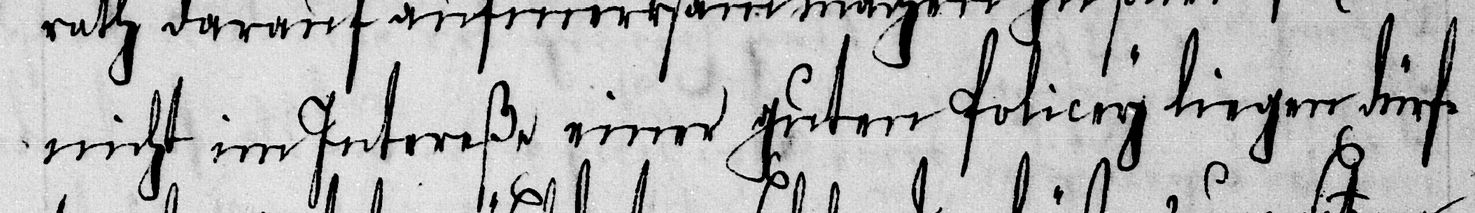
nicht im Intereße einer guten Policey liegen dürf¬
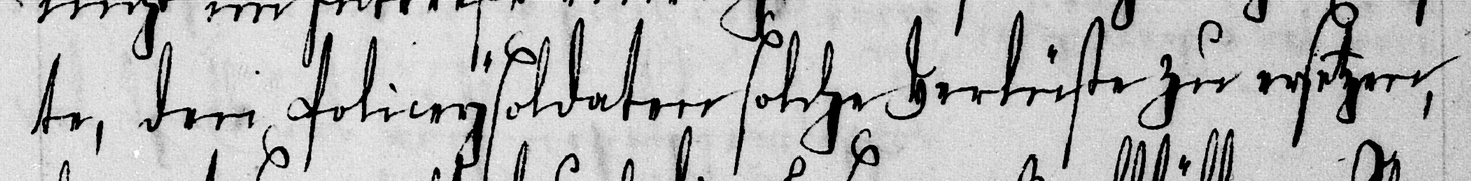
te, den Policeysoldaten solche Verluste zu ersetzen,
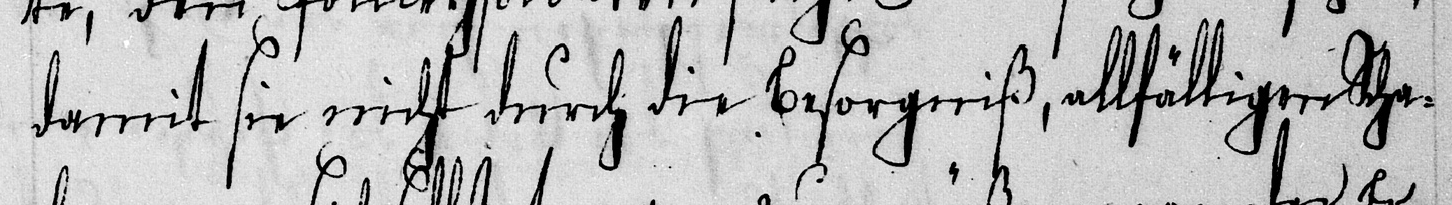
damit sie nicht durch die Bersorgniß, allfälligen Sch¬
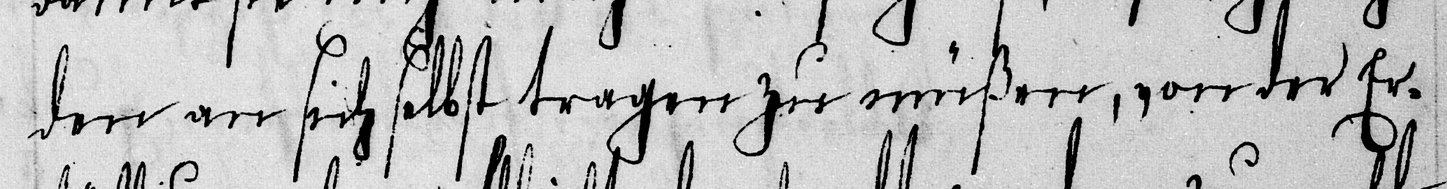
aden an sich selbst tragen zu müßen, von der Er¬
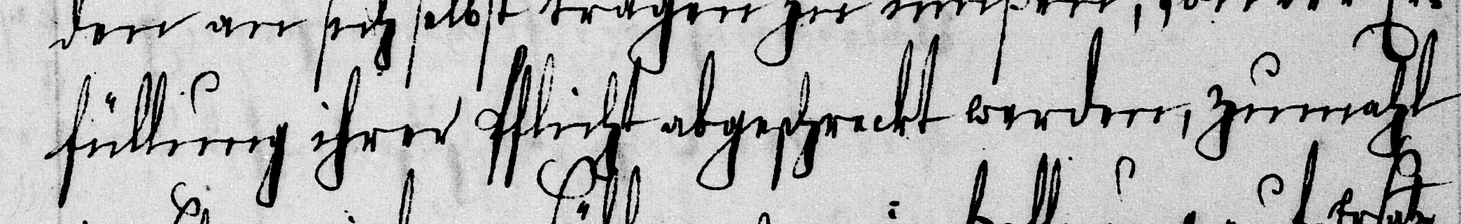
füllung ihrer Pflicht abgebracht werden, zumahl
